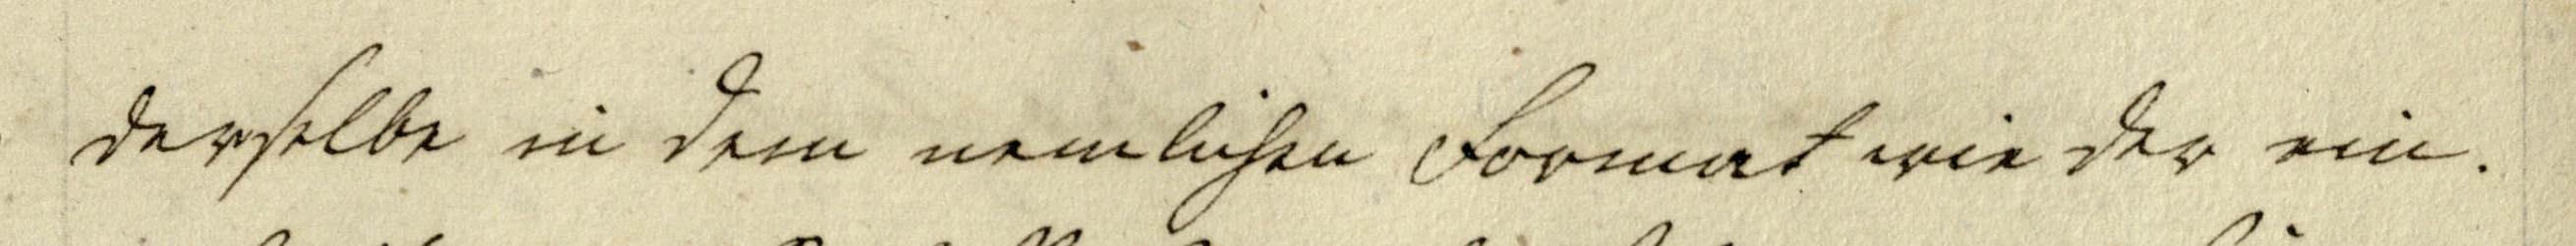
derselbe in dem nemlichen Format wie der ein¬
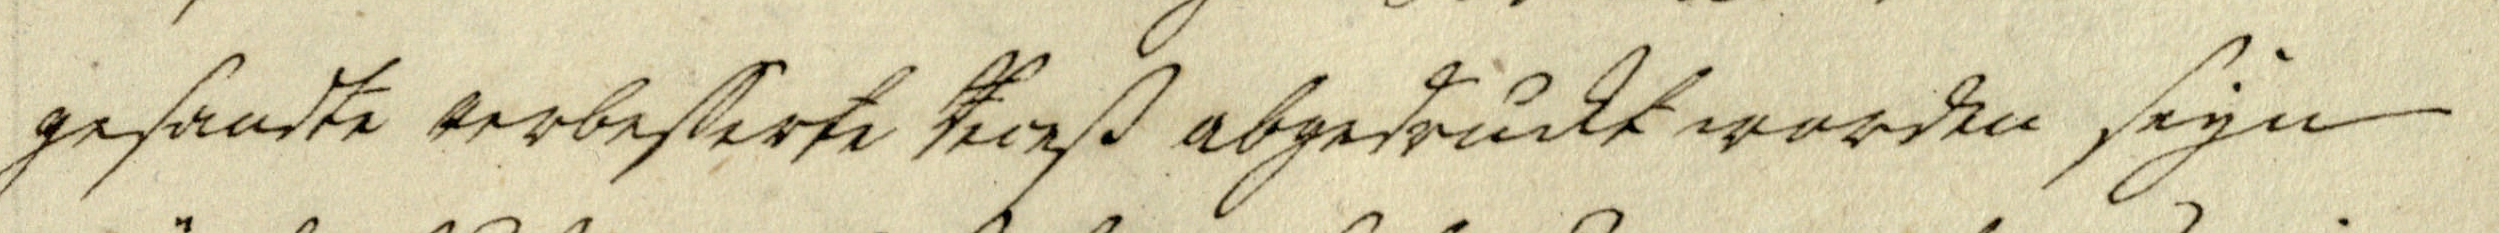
gesandte verbesserte Receß abgedruckt worden seÿn
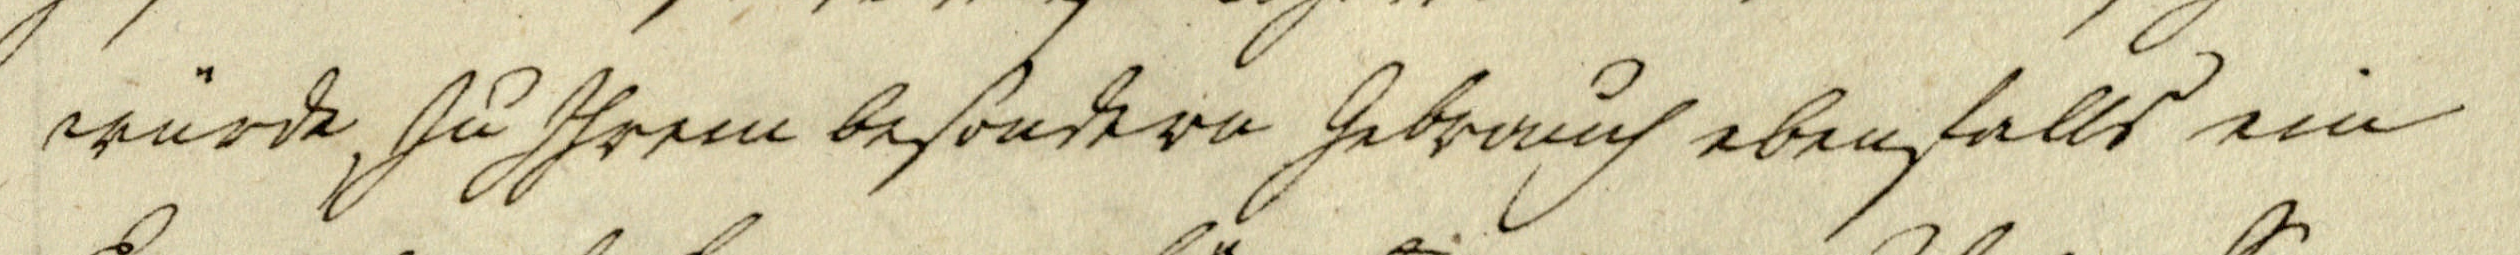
würde, zu Ihrem besondern Gebrauch ebenfalls ein
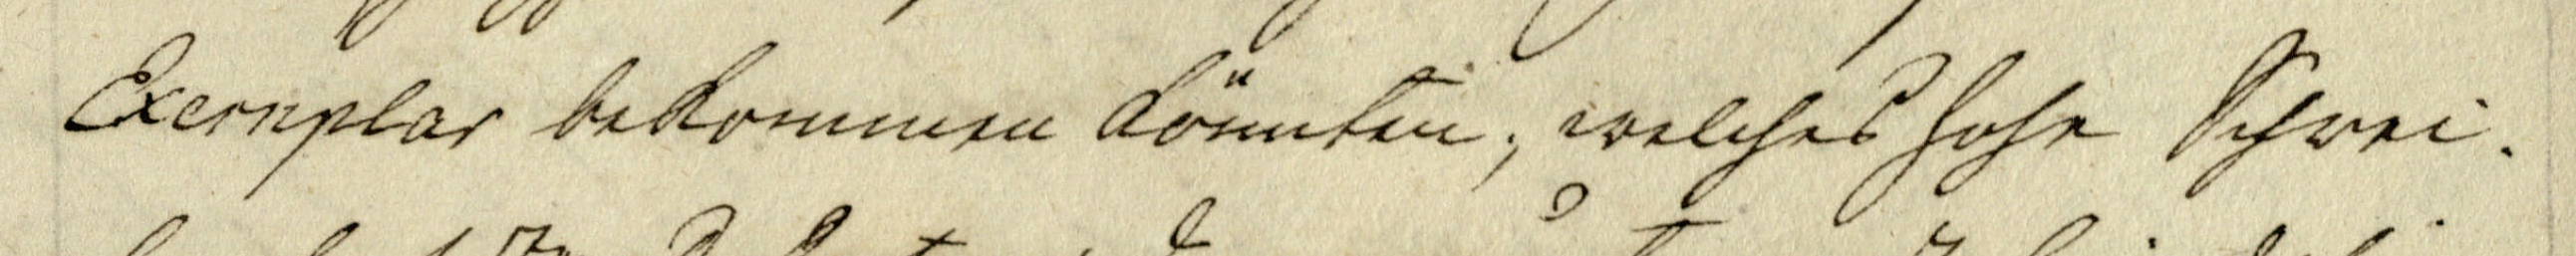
Exemplar bekommen könnten, welches hohe Schrei¬
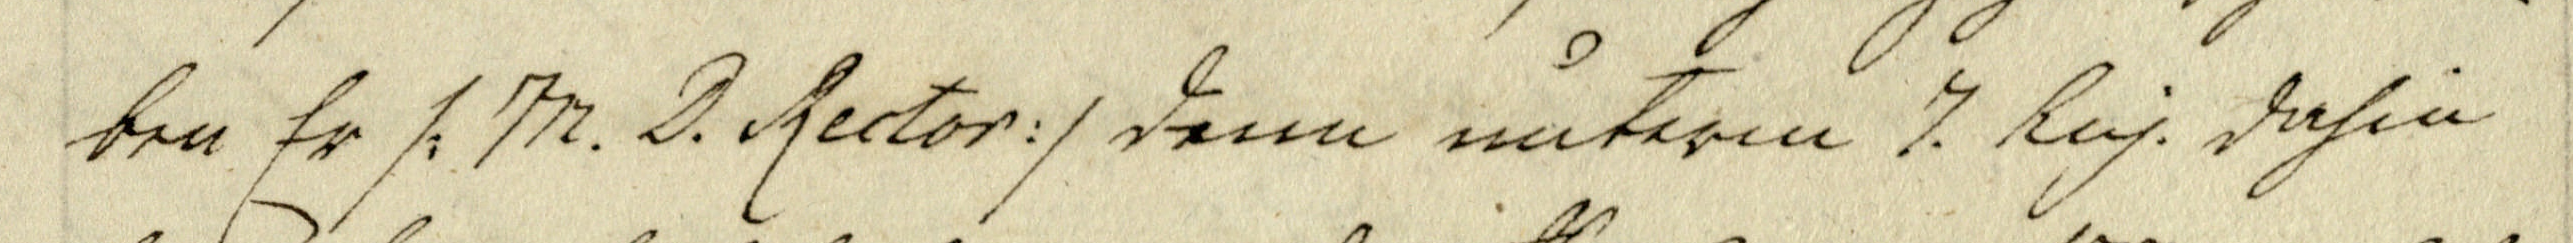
ben Er /: M. D. Rector :/ denn unterm 7. huj. dahin
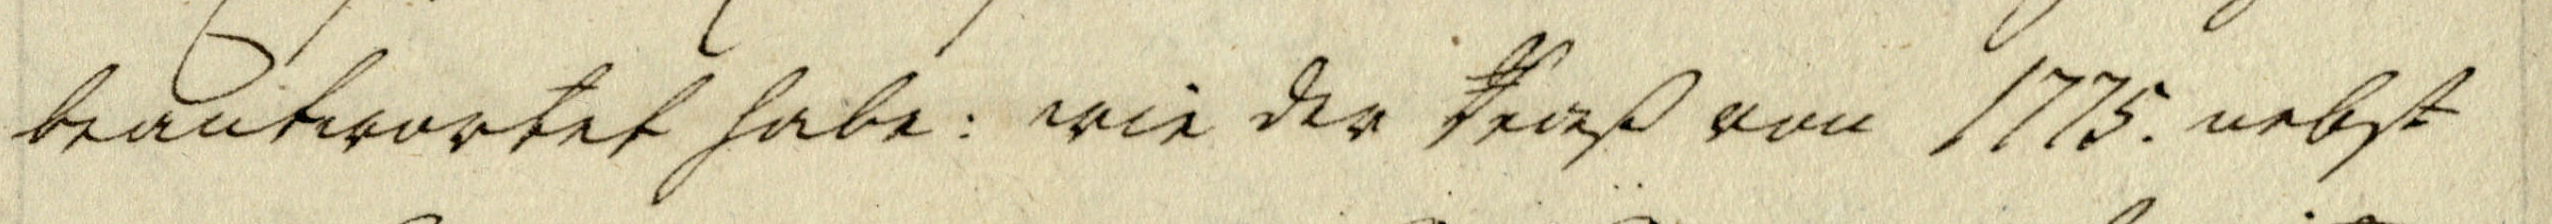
beantwortet habe: wie der Receß von 1775. nebst
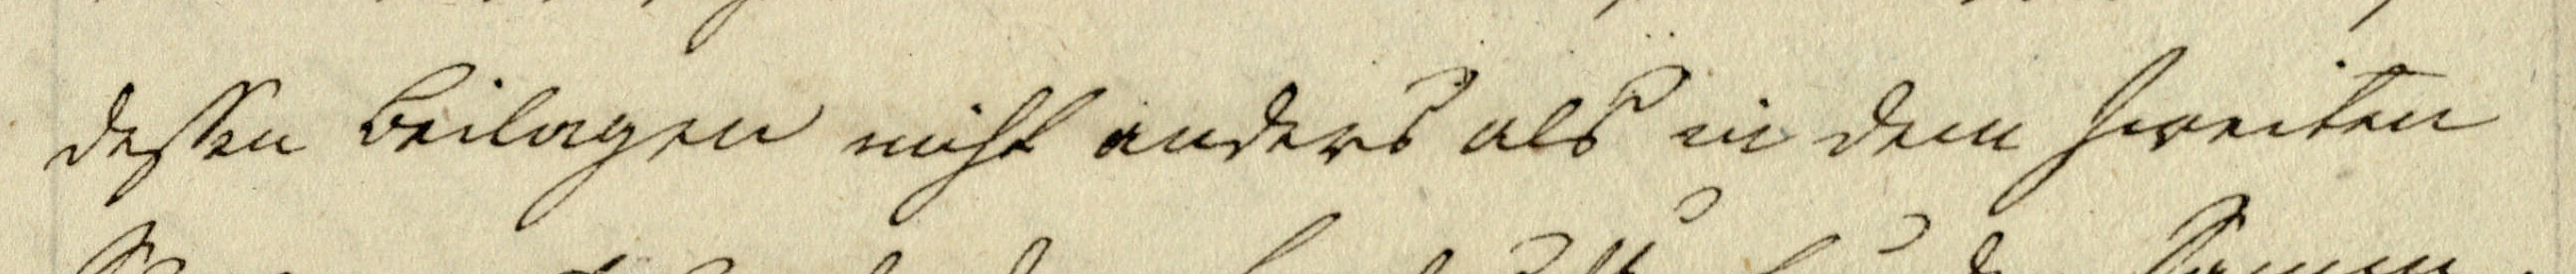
dessen Beilagen nicht anders als in dem zweiten
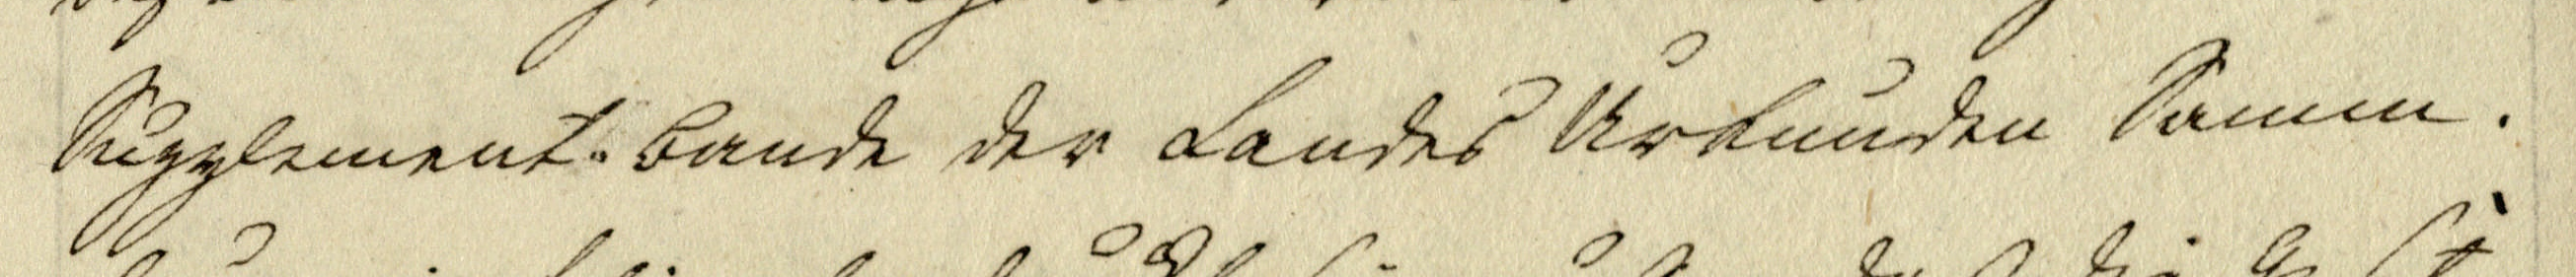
Supplement-Bande der Landes Urkunden Samm¬
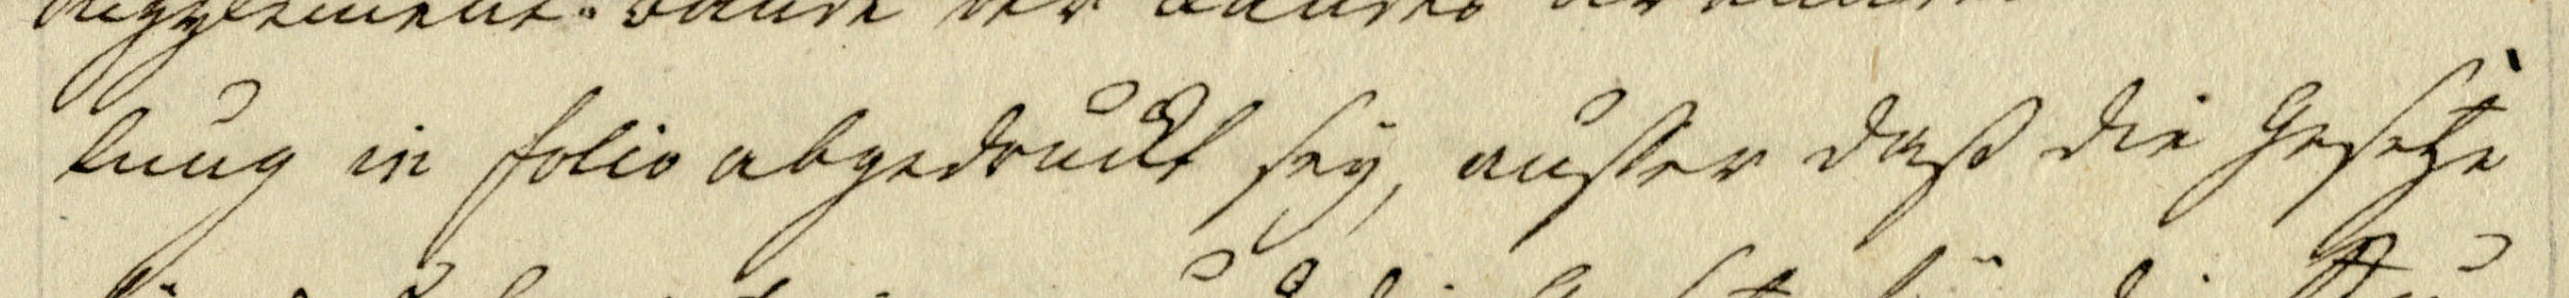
lung in folio abgedruckt seÿ, ausser daß die Gesetze
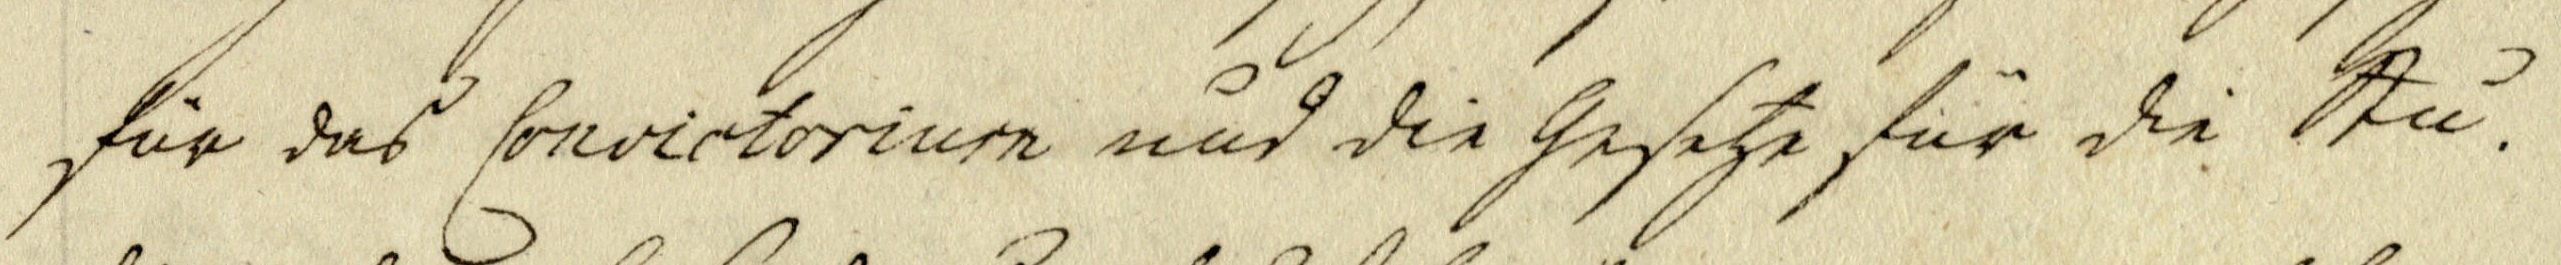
für das Convictorium und die Gesetze für die Stu¬
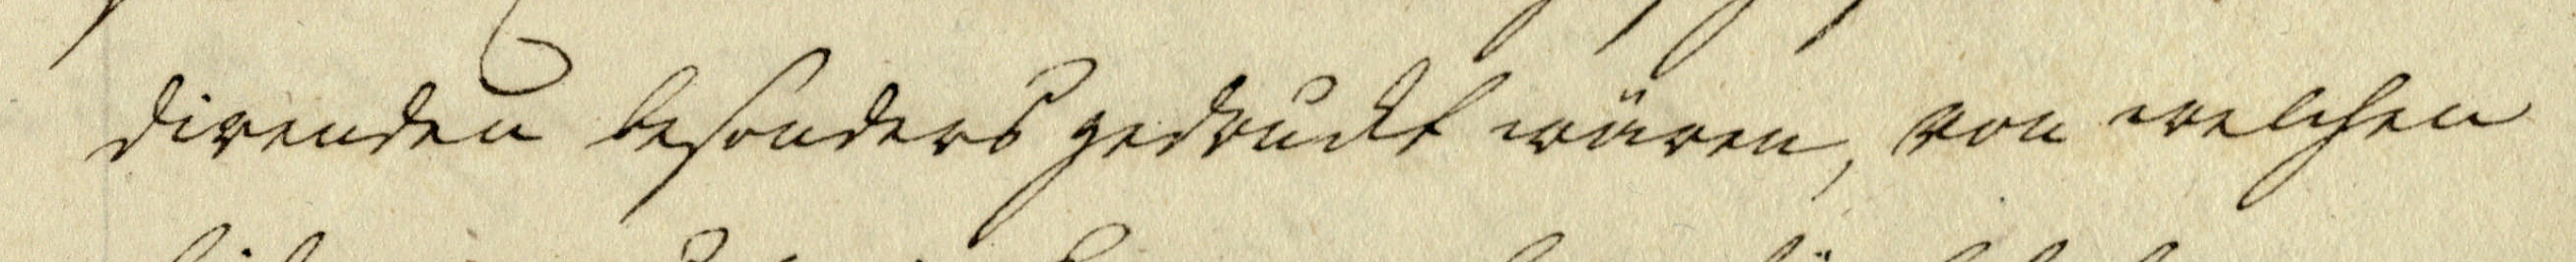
direnden besonders gedruckt wären, von welchen
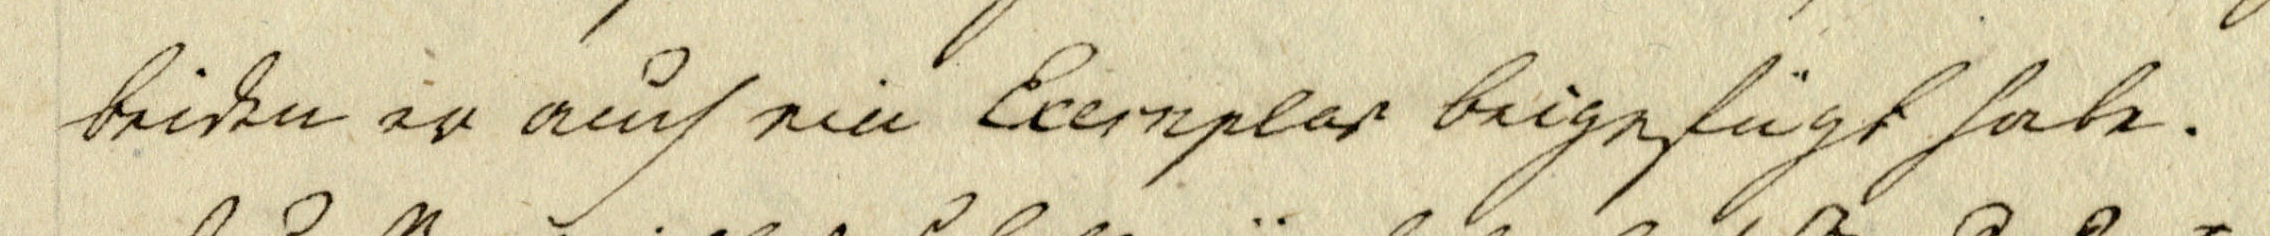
beiden er auch ein Exemplar beigefügt habe.
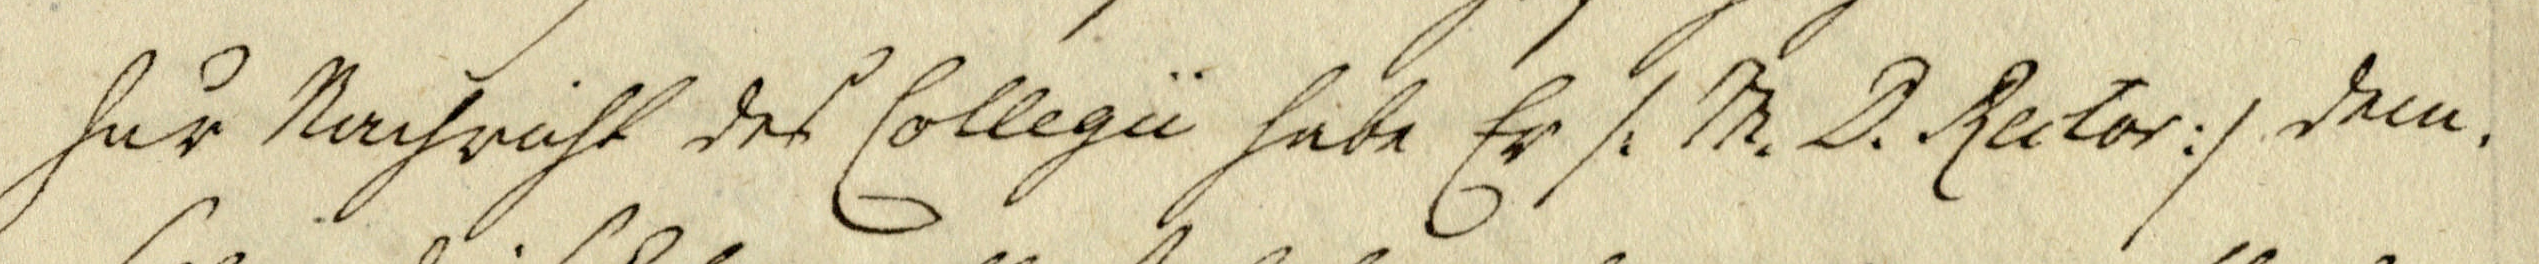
Zur Nachricht des Collegio habe Er /: M. D. Rector :/ dem¬
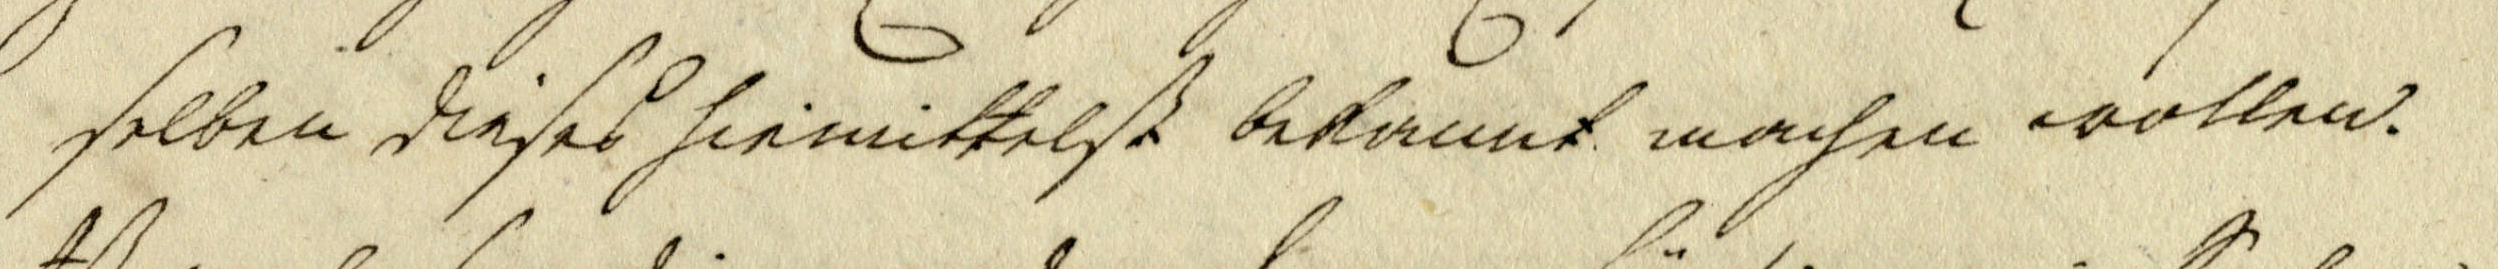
selben dieses hiemittelst bekannt machen wollen.
